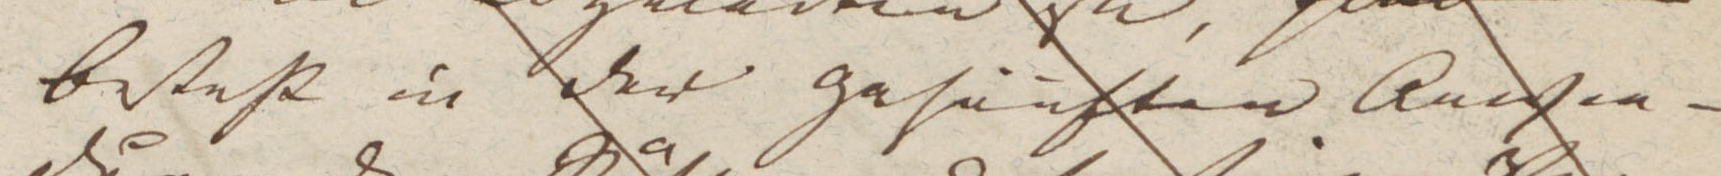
besteht in der gesäuften Anwen-
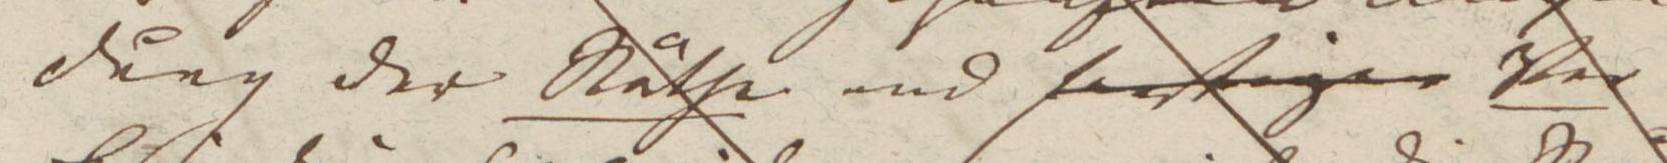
dung der Näthe und sonstigen Ver-
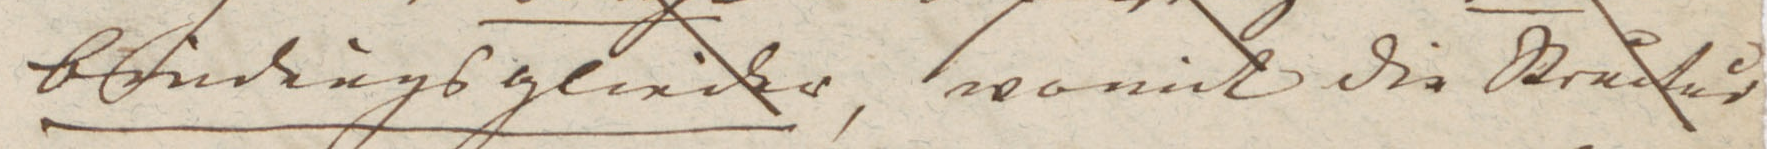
bindungsglieder, womit die Structur
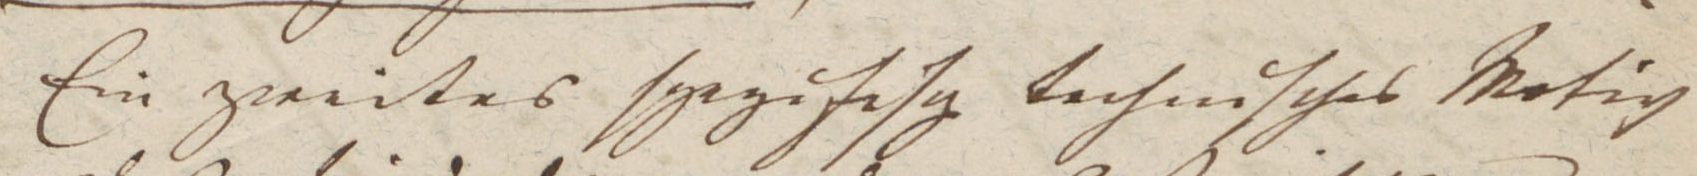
Ein zweites spezifisch technisches Motiv
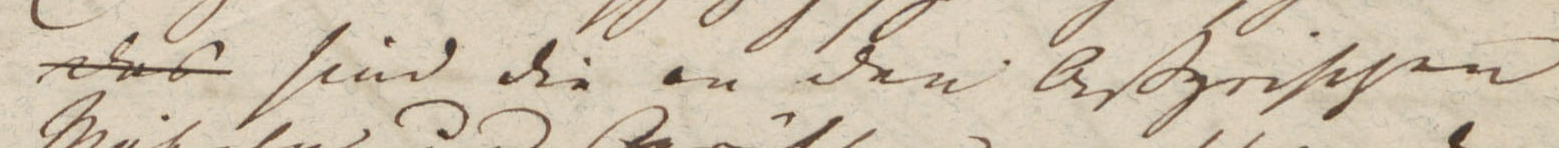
das sind die an den Assyrischen
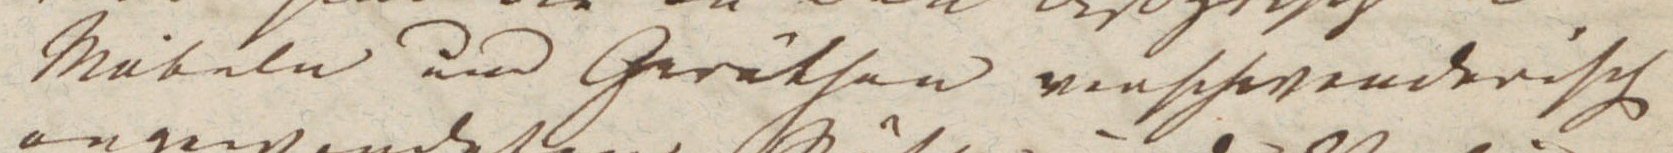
Möbeln und Geräthen verschwenderisch
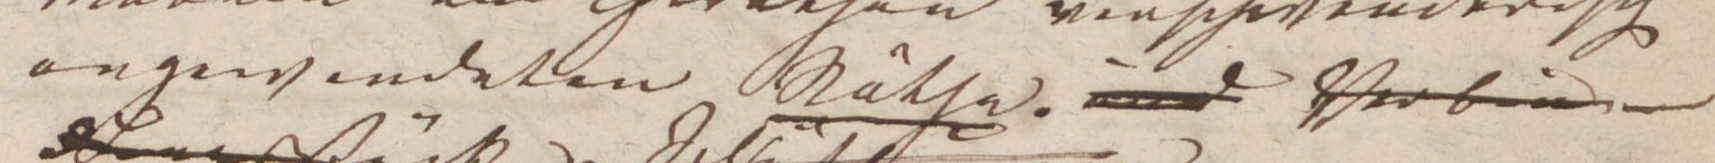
angewendeten Näthe. und Verbin-
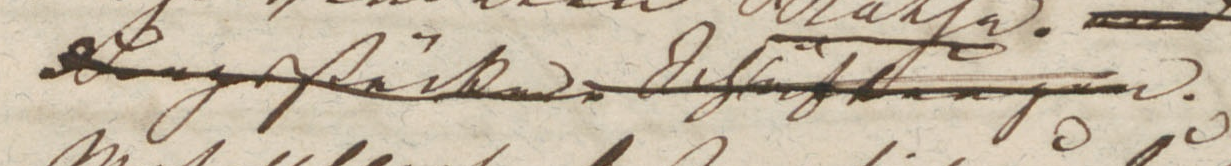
dungsstücke Schläftungen.
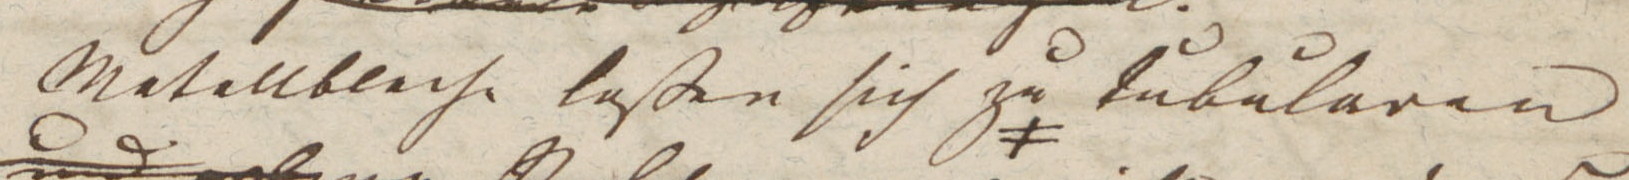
Metallbleche lassen sich zu tubularen
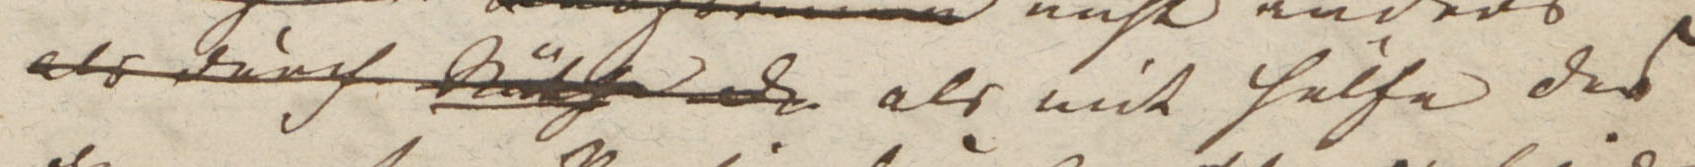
als durch Näthe di als mit Hülfe ders
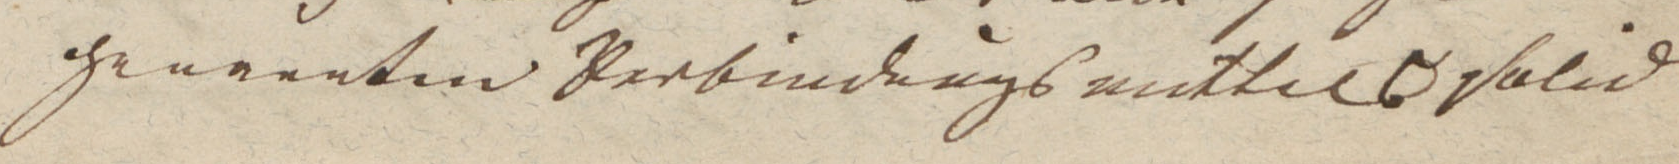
genannten Verbindungsmittels solid
